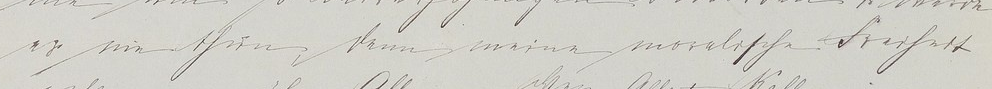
es nie thun, denn meine moralische Freiheit
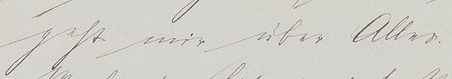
geht mir über Alles. –
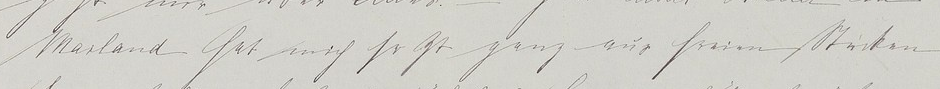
Mailand hat mich sr Zt ganz aus freien Stücken
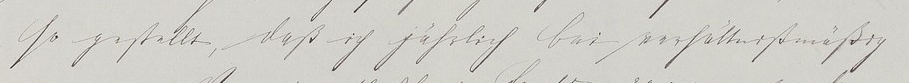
so gestellt, daß ich jährlich bei verhältnißmäßig
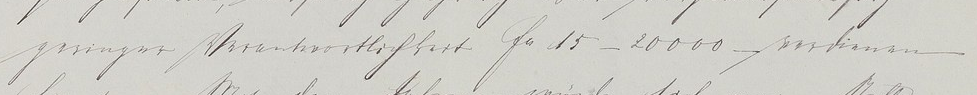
geringer Verantwortlichkeit fr 15–20000 – verdienen
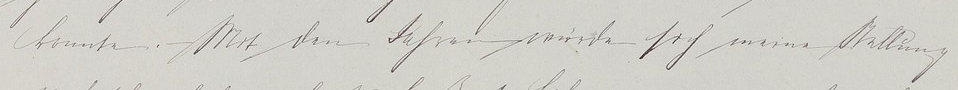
konnte. – Mit den Jahren würde sich meine Stellung
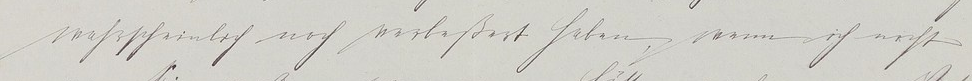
wahrscheinlich noch verbeßert haben, wenn ich nicht
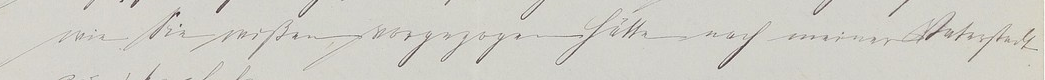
wie Sie wißen, vorgezogen hätte nach meiner Vaterstadt
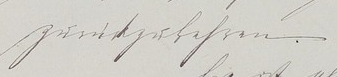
zurückzukehren.
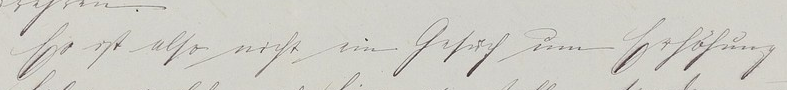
Es ist also nicht ein Gesuch um Erhöhung
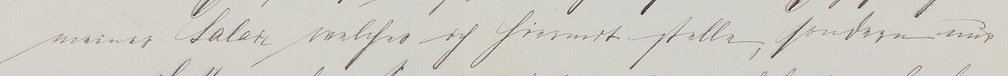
meines Salair welches ich hiermit stelle, sondern nur
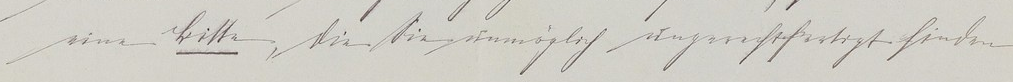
eine Bitte, die Sie unmöglich ungerechtfertigt finden
